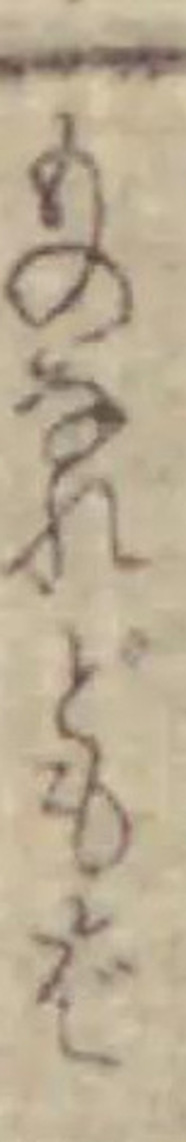ものなれどもば
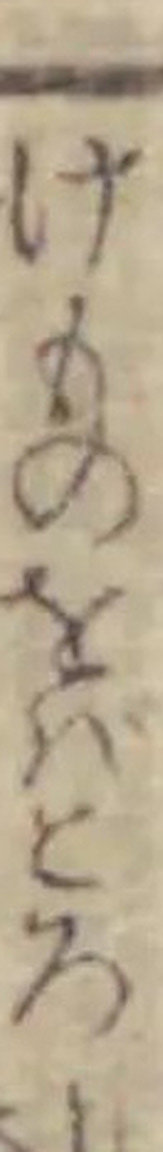けものをばころ
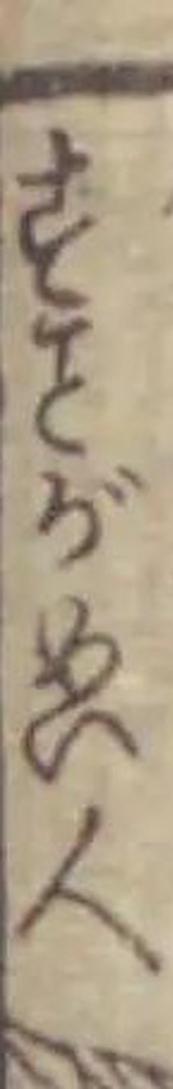すことがめい人
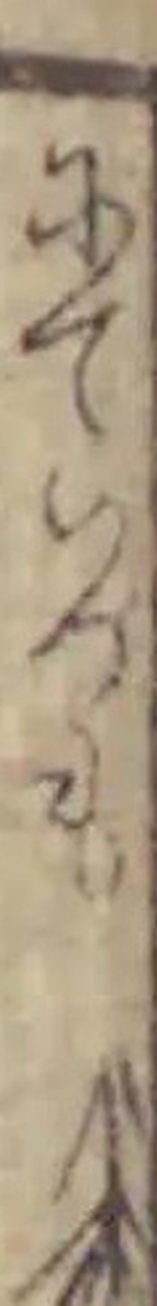にていつも
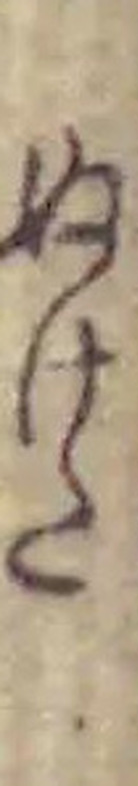ぬけた
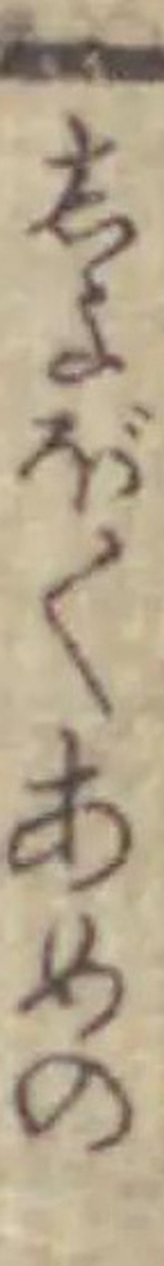しよぼ〳〵あめの
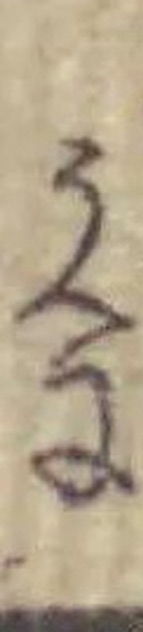うへに
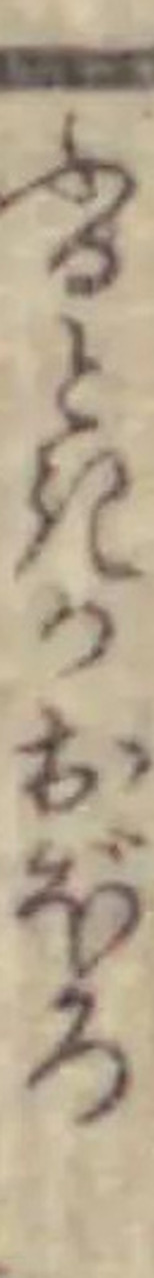ふるときかおぼろ
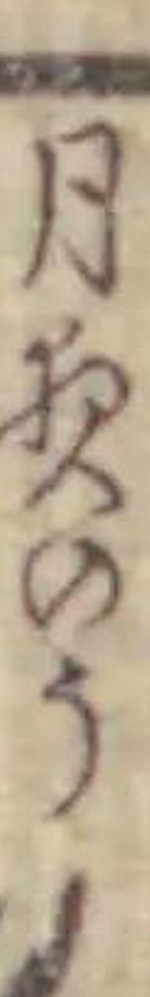月夜のう
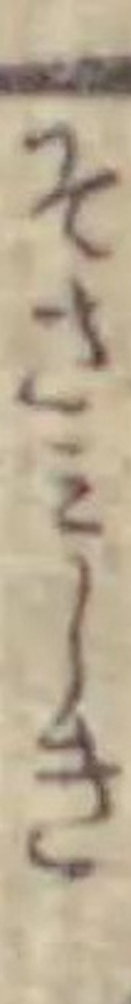そさみしき
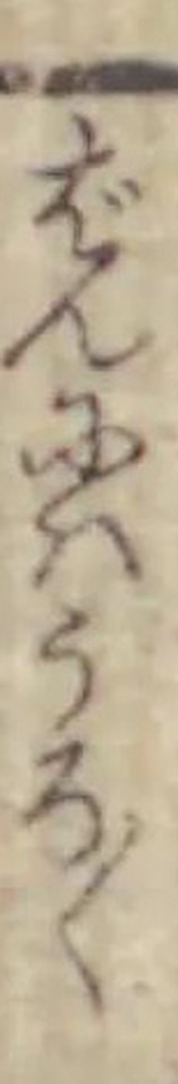ばんにはうろ〳〵
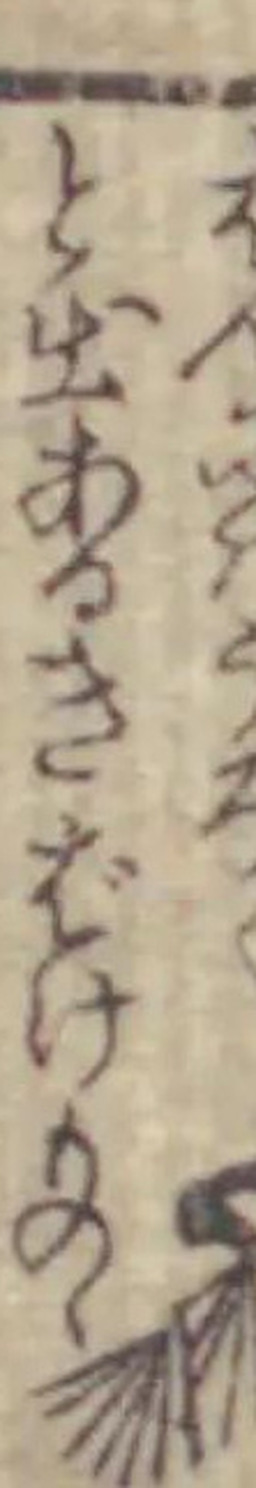と出あるきばけものゝ
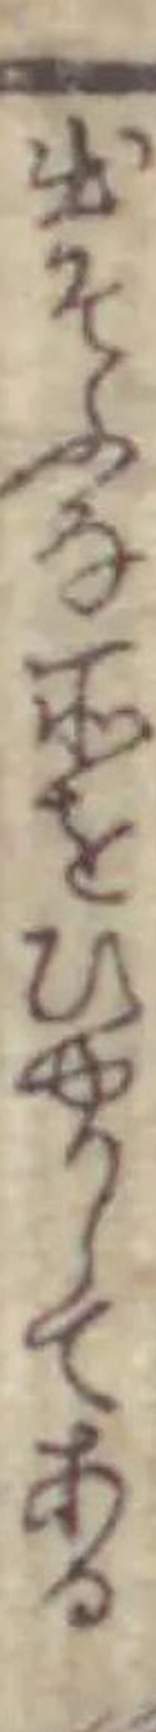出そうふな所をひやかしてある
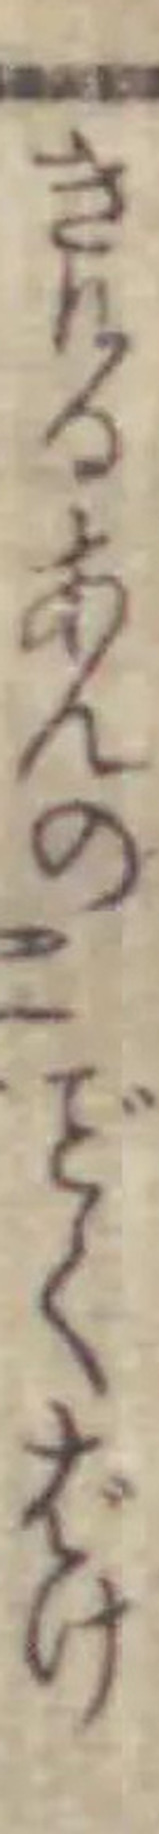きけるあんのごとくばけ
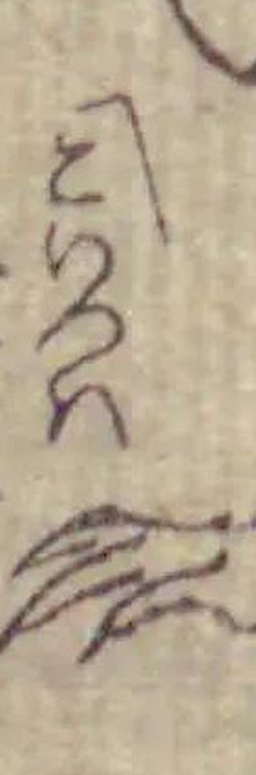〽こいつは
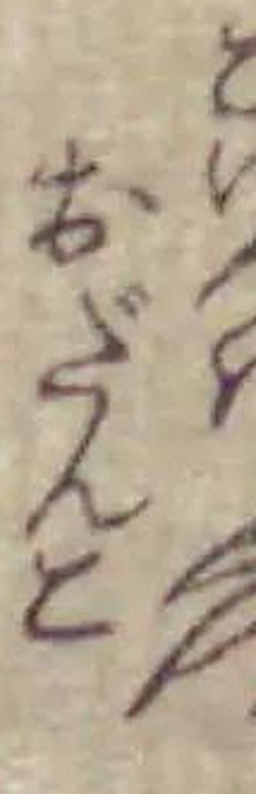おだんこ
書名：化物敵討 2巻
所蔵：国立国会図書館 National Diet Library, JAPAN
